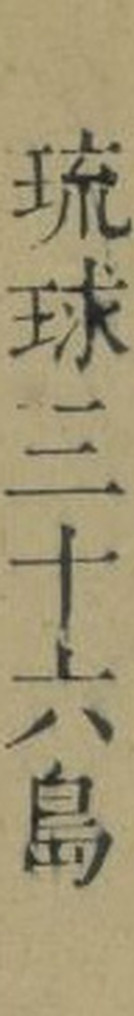琉球三十六島
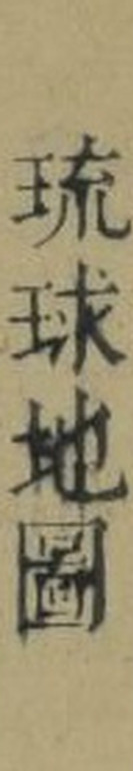琉球地図

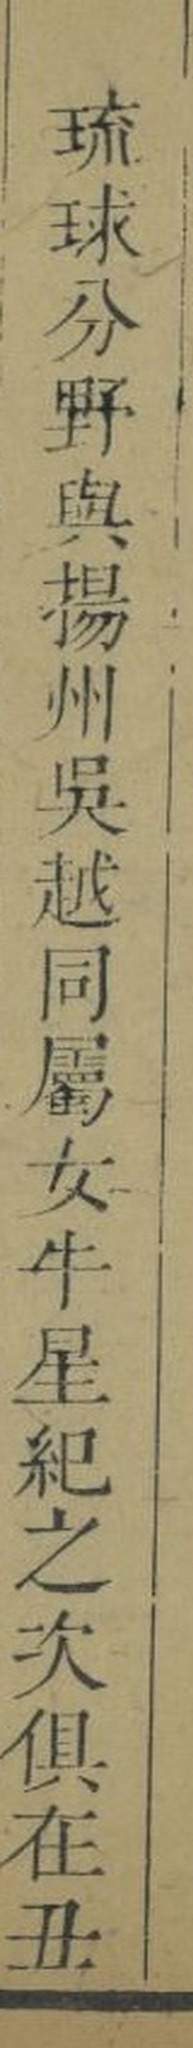琉球分野与揚州呉越同属女牛星紀之次俱在丑
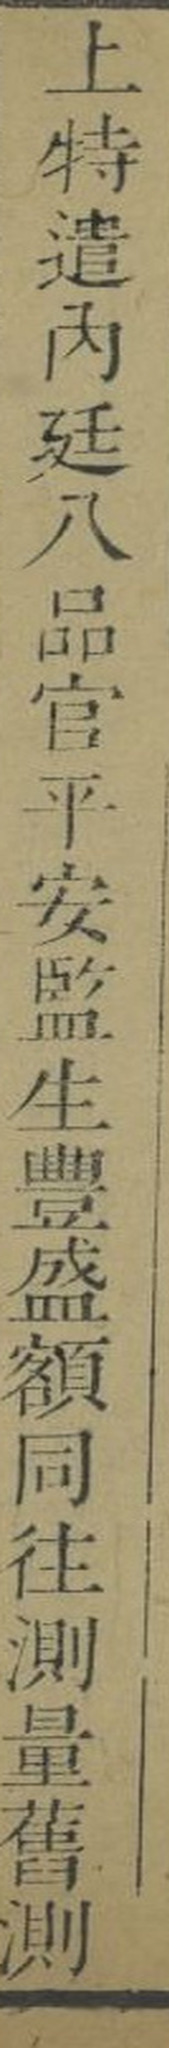上特遣內廷八品官平安監生豊盛額同往測量旧測
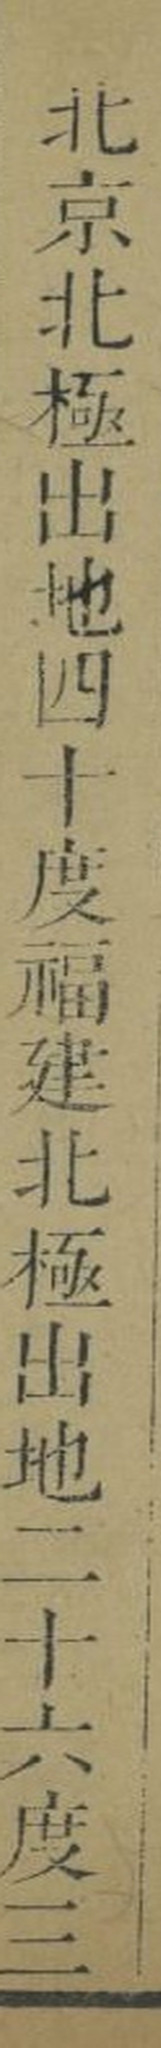北京北極出地四十度福建北極出地二十六度三
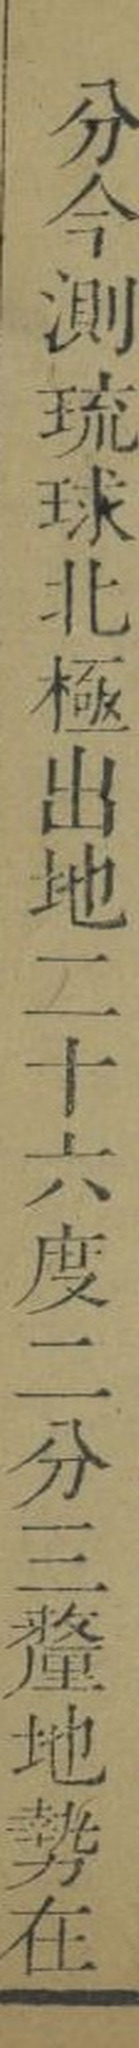分今測琉球北極出地二十六度二分三釐地勢在
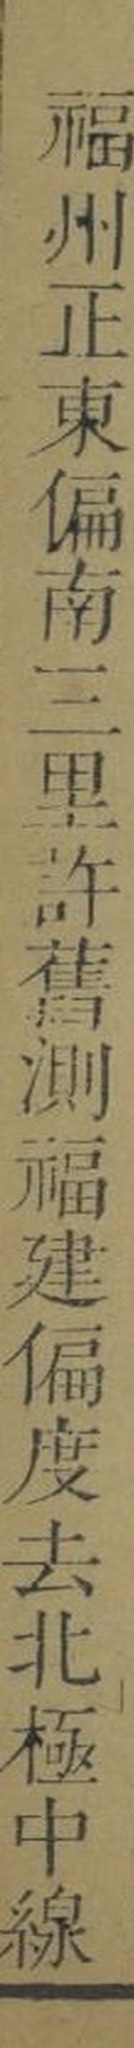福州正東偏南三里許旧測福建偏度去北極中線

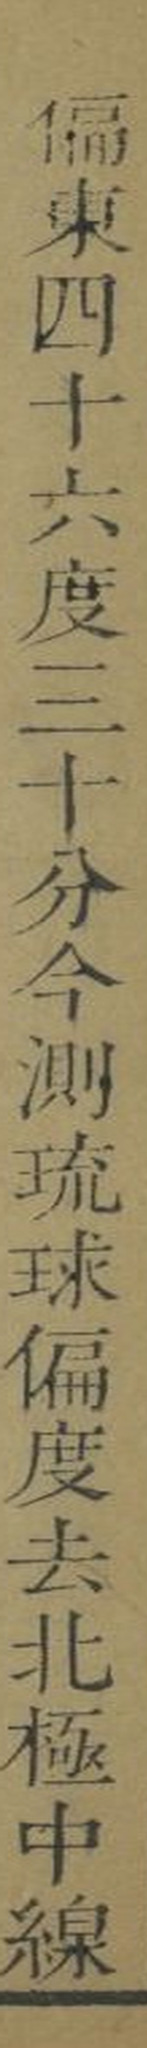偏東四十六度三十分今測琉球偏度去北極中線
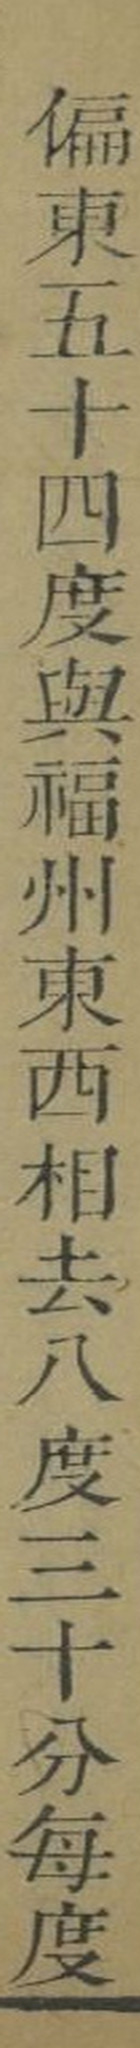偏東五十四度与福州東西相去八度三十分毎度
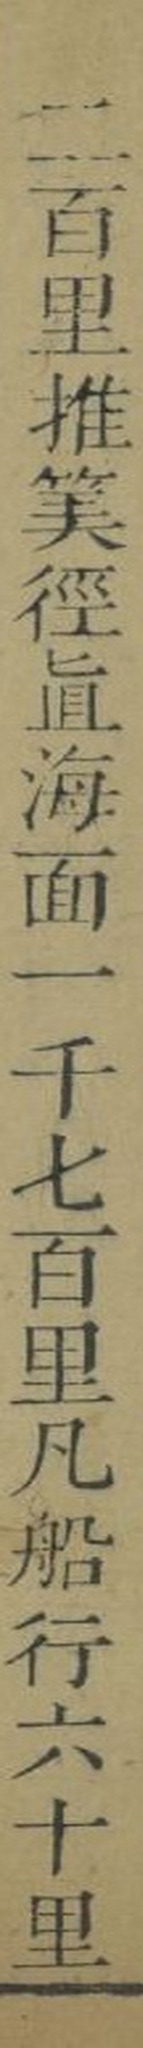二百里推算径直海面一千七百里凡船行六十里
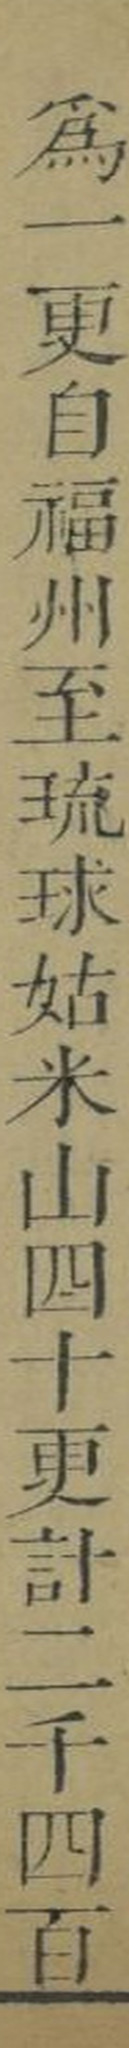為一更自福州至琉球姑米山四十更計二千四百
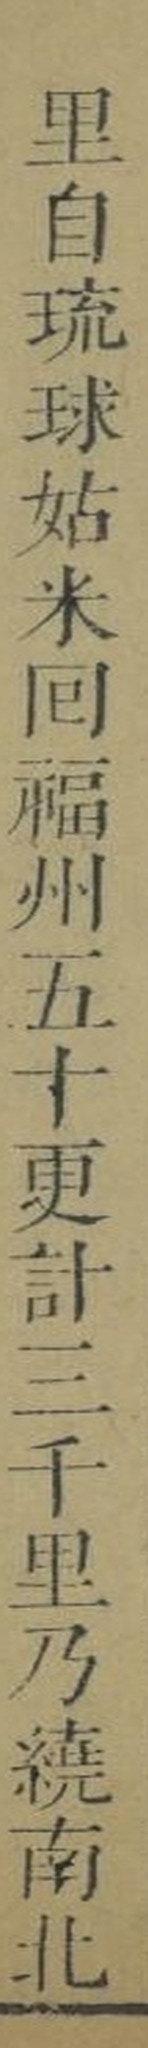里自琉球姑米回福州五十更計三千里乃繞南北
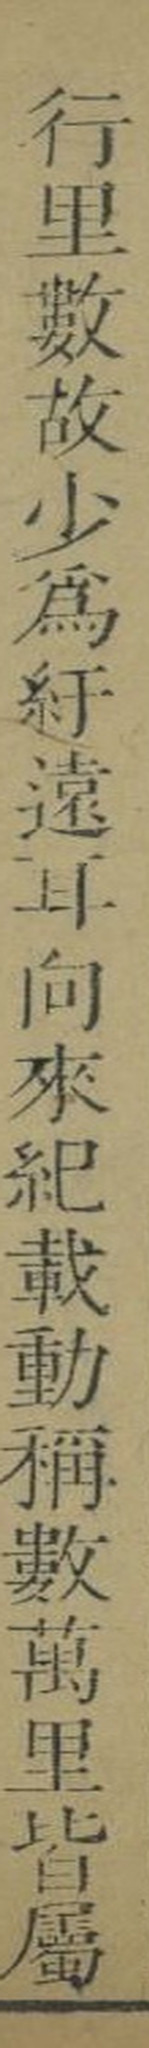行里数故少為紆遠耳向来紀載動称数万里皆属
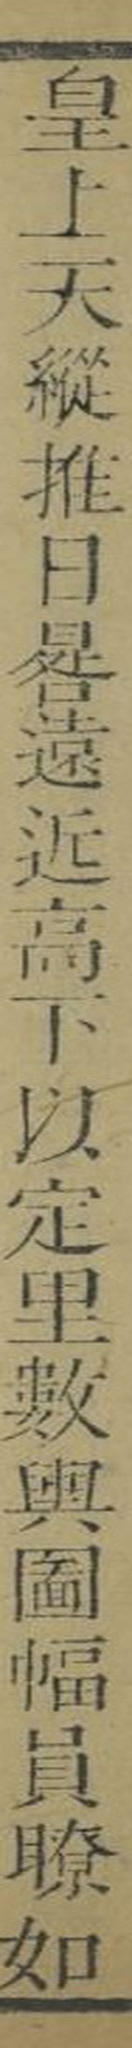皇上天縦推日晷遠近高下以定里数輿図幅員瞭如
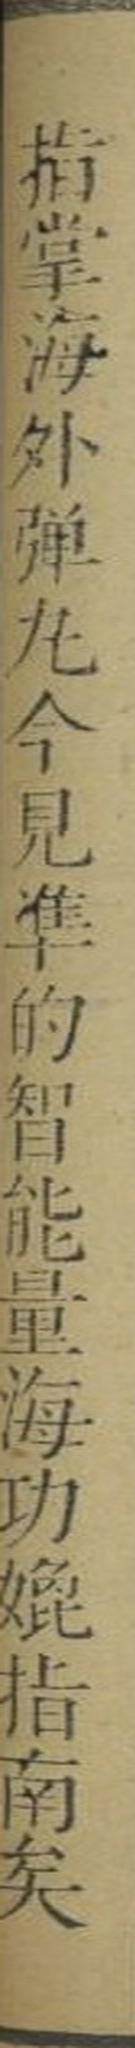指掌海外弾丸今見準的智能量海功媲指南矣
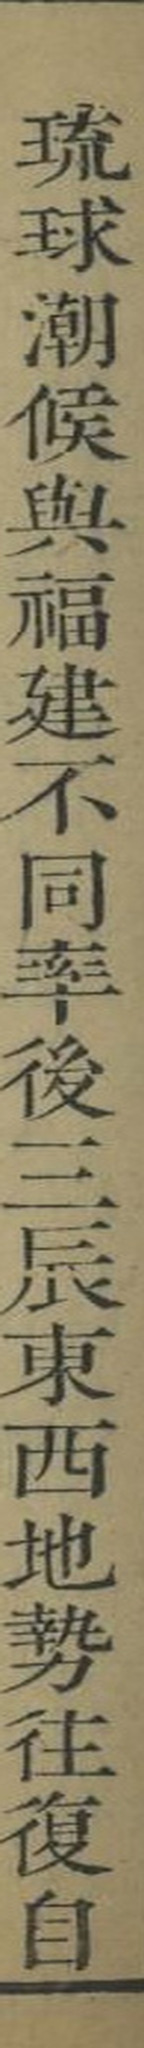琉球潮候与福建不同率後三辰東西地勢往復自
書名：中山伝信録 巻四
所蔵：University of the Ryukyus Library
